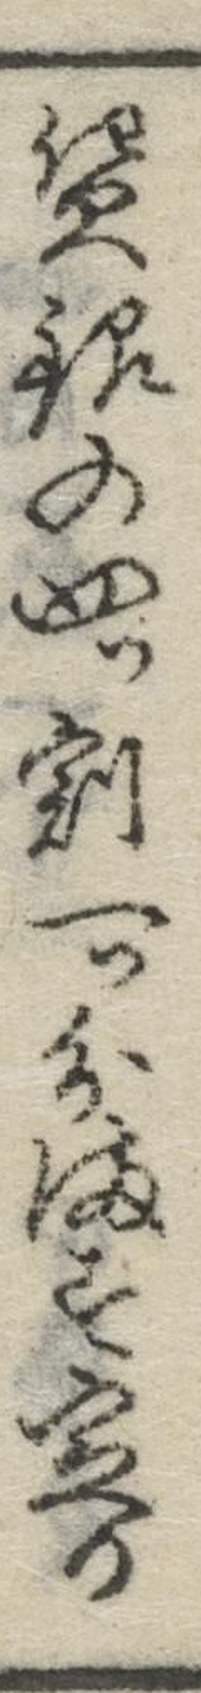賃銀の四つ割一つ分満す定り
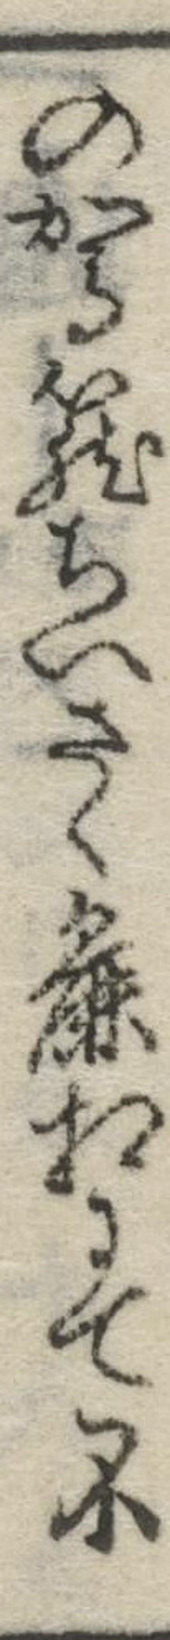の駕籠ちいさく麁相にて不
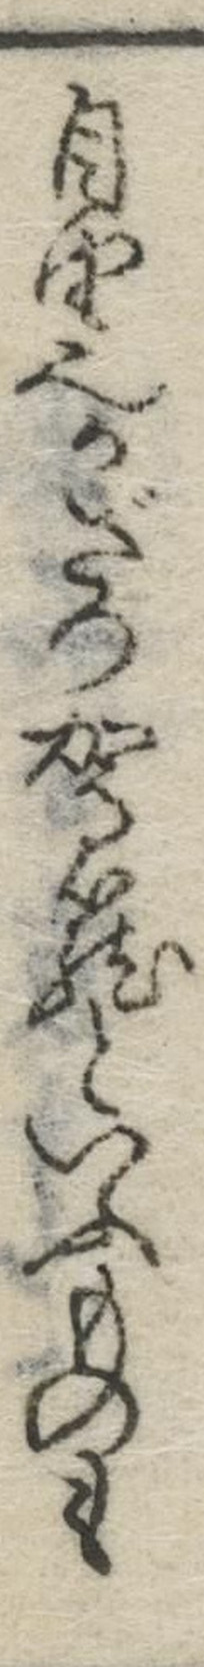自由也かざり駕籠といふものも
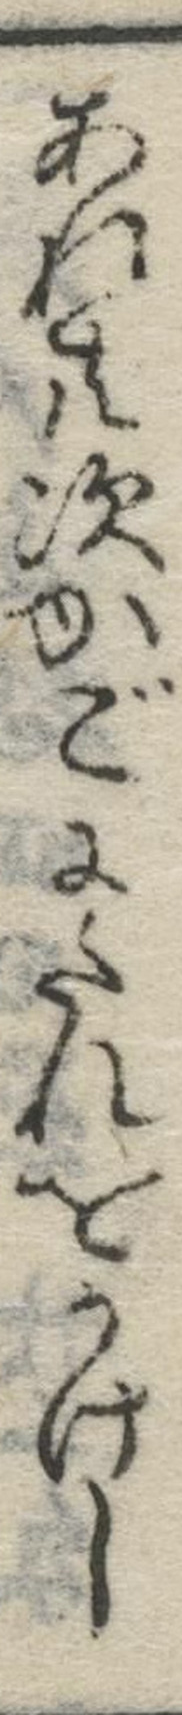あれ共次かごにたれをうけし
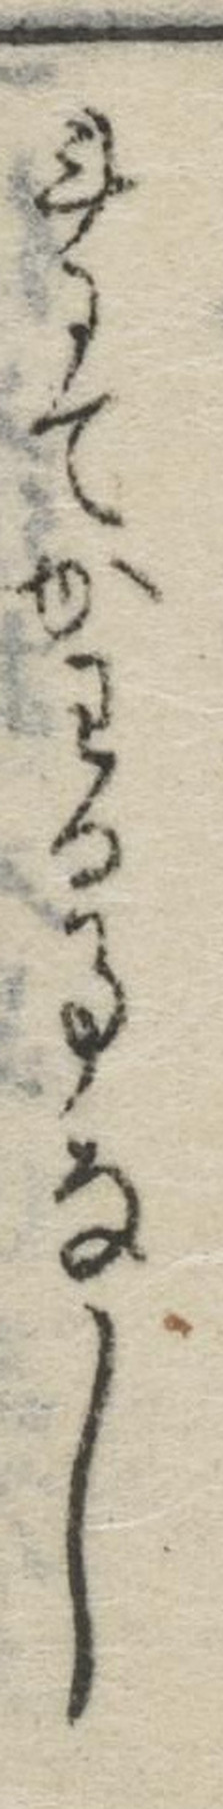斗にてかわる事なし
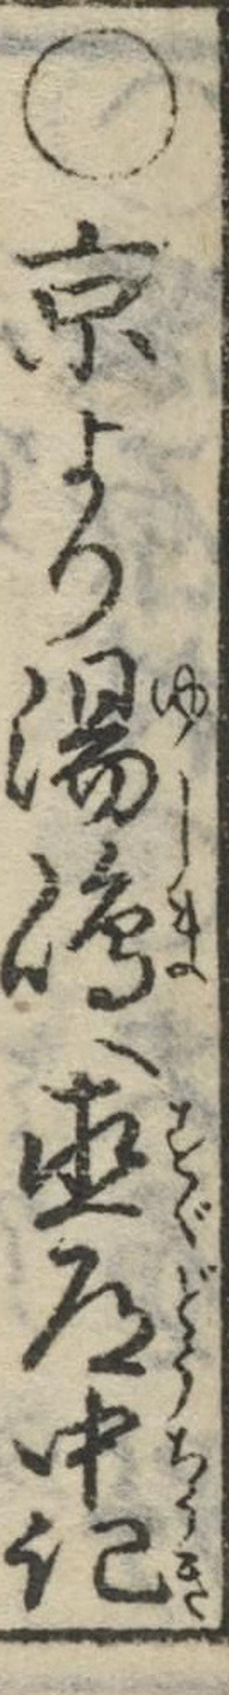〇京より湯嶋へ直道中記
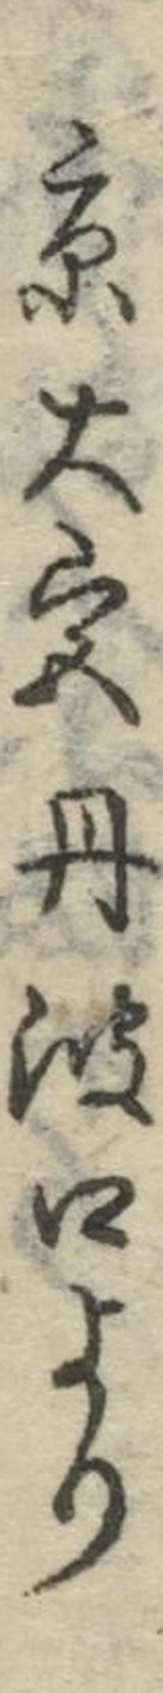京大宮丹波口より
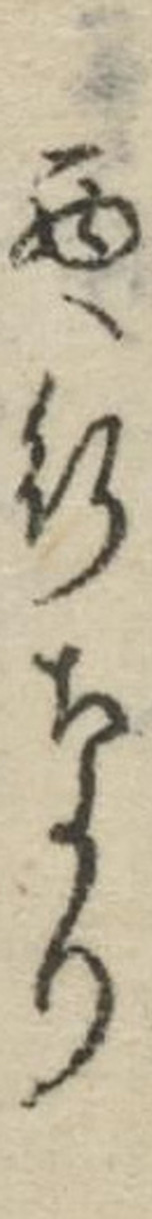西へ行なり
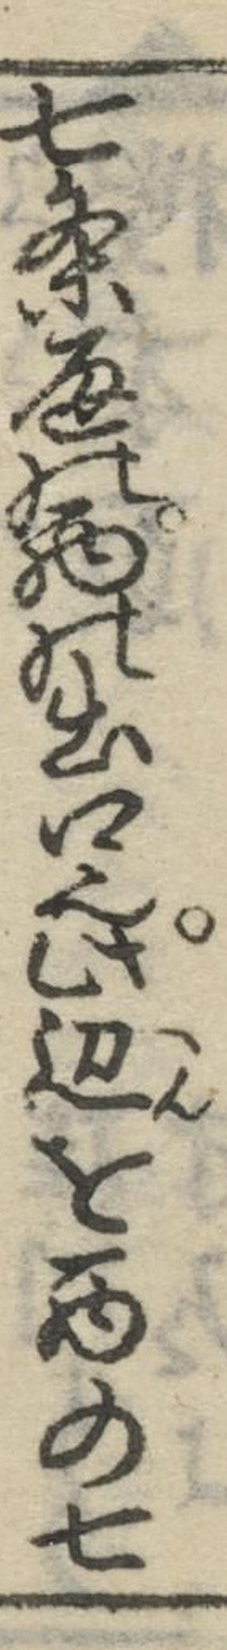七条通の西の出口也。此辺を西の七
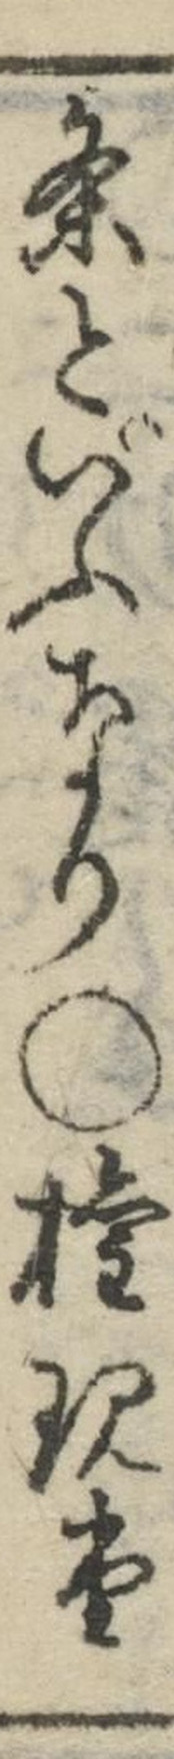条といふなり〇権現堂
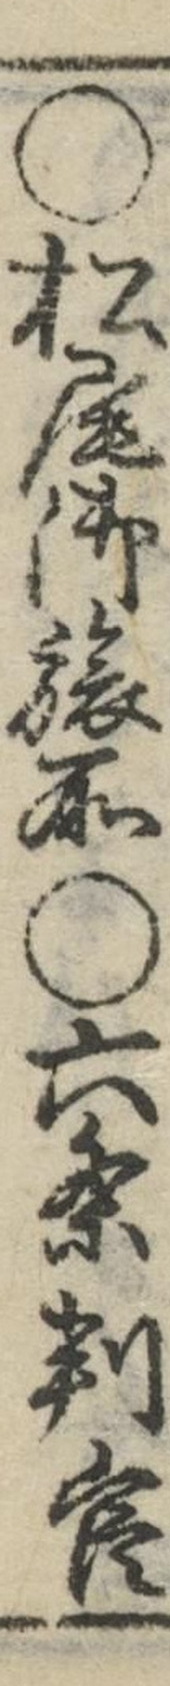〇松尾御旅所〇六条判官
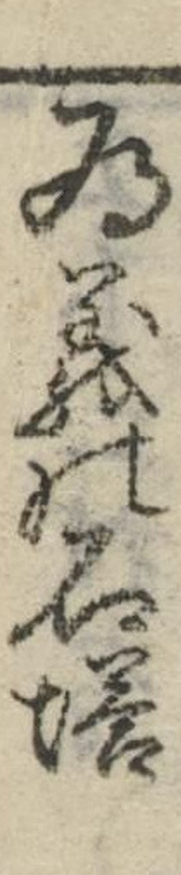為義の石塔
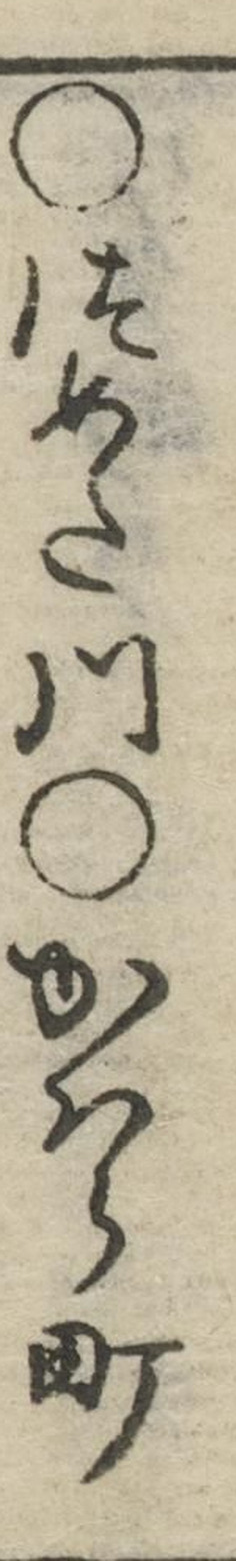〇つめた川〇かはら町
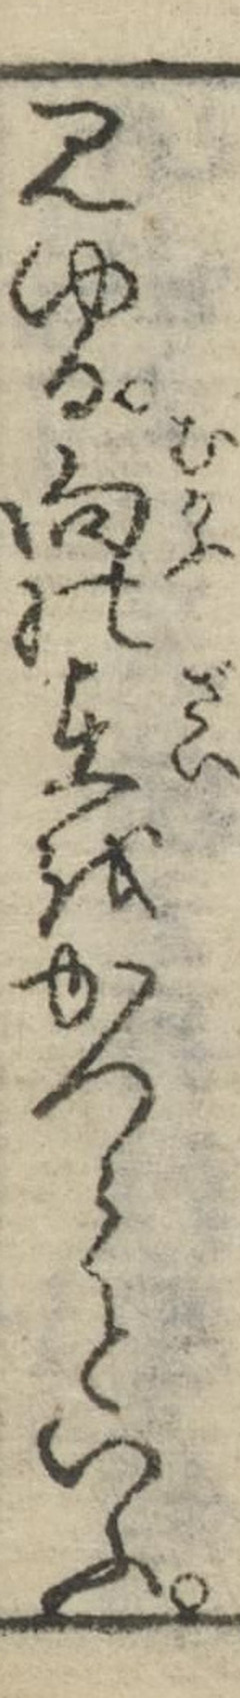見ゆる。向の在をかつらといふ。

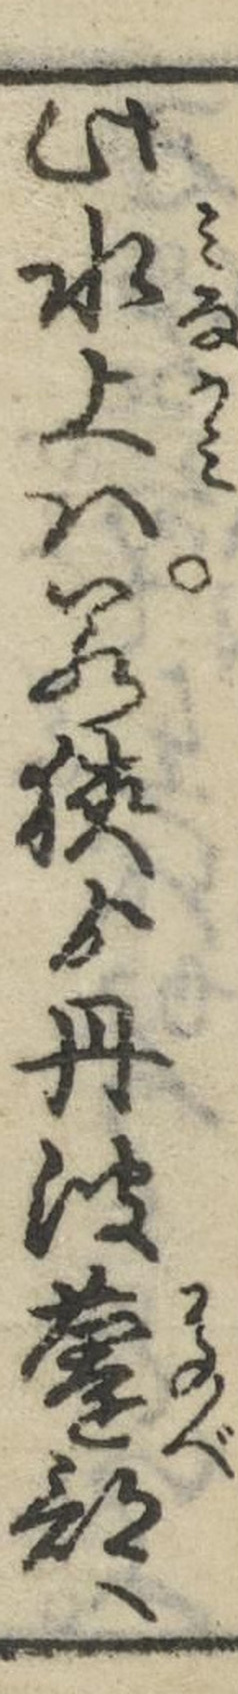此水上は。若狭ゟ丹波園部郡へ
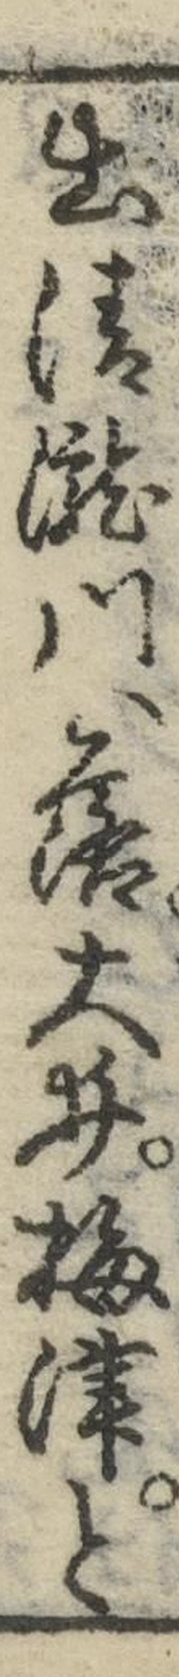出。清瀧川へ落。大井。梅津。と
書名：但州城崎浴湯辧
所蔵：東京大学地震研究所図書室 Earthquake Research Institute Library, The University of Tokyo, JAPAN
